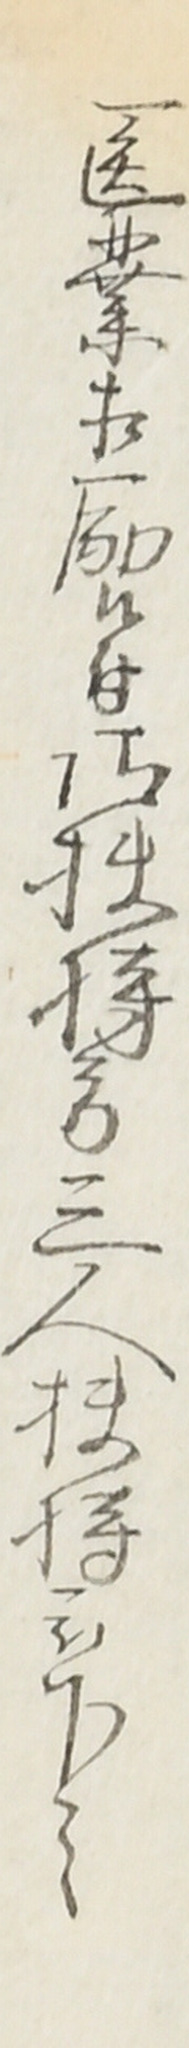医業相励候付御扶持方三人扶持被下之
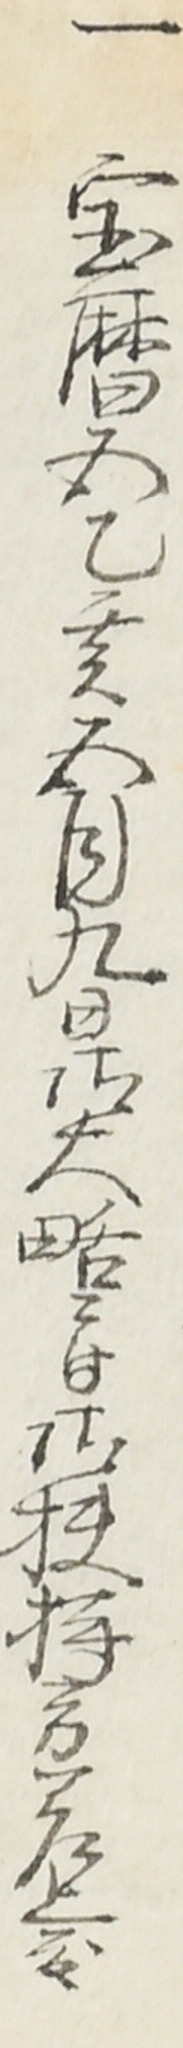一宝暦五乙亥五月九日御大略ニ付御扶持方差上度
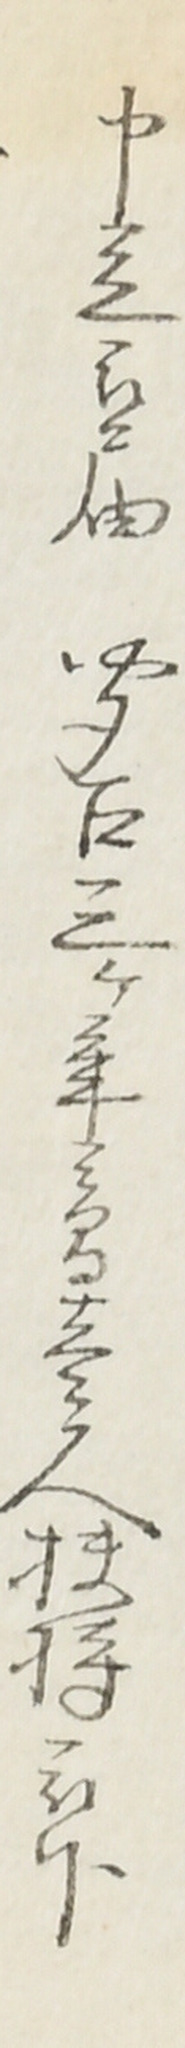申立被届聞召三ヶ年之間壱人扶持被下
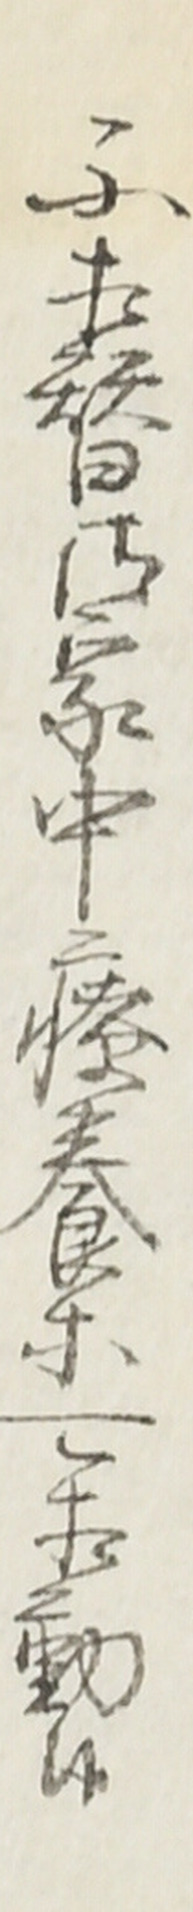不相替御家中療養等可相勤候
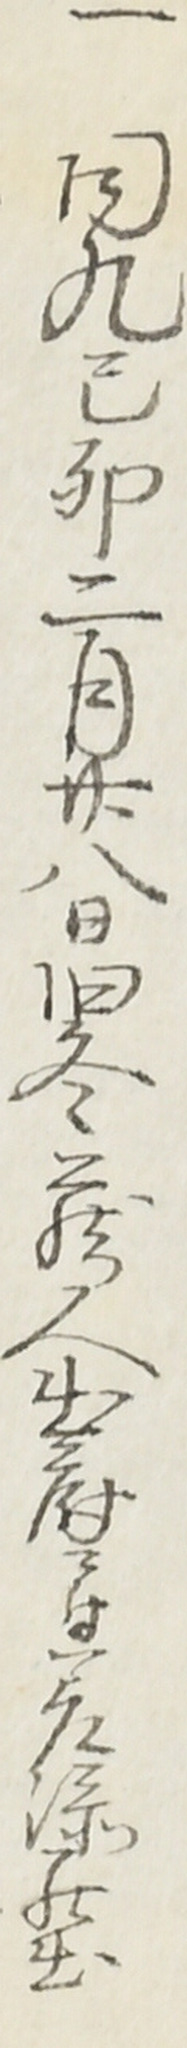一同九己卯二月廿八日旧冬蔵人出府ニ付差添罷出
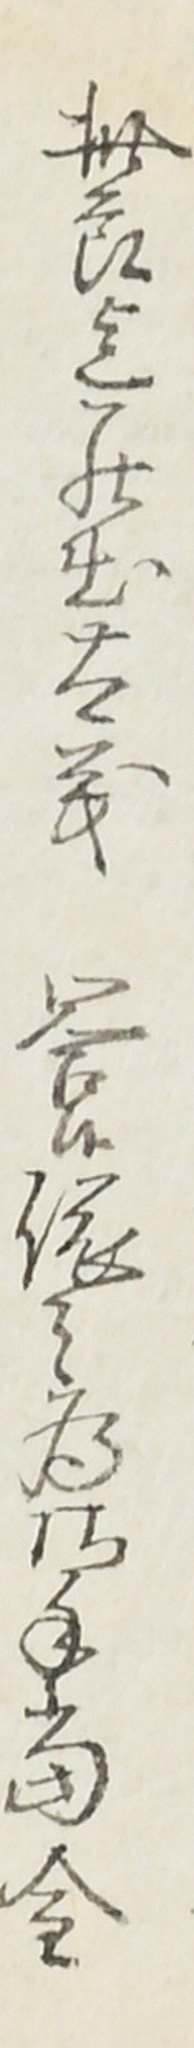此節迄罷出太義思召候依之為御手当金
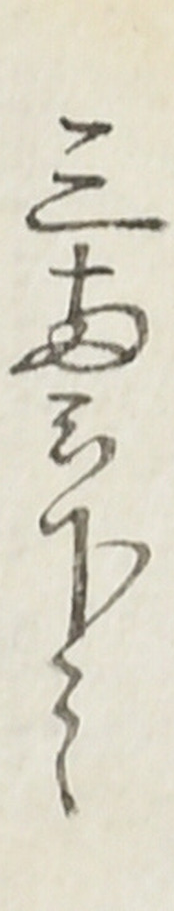三両被下之
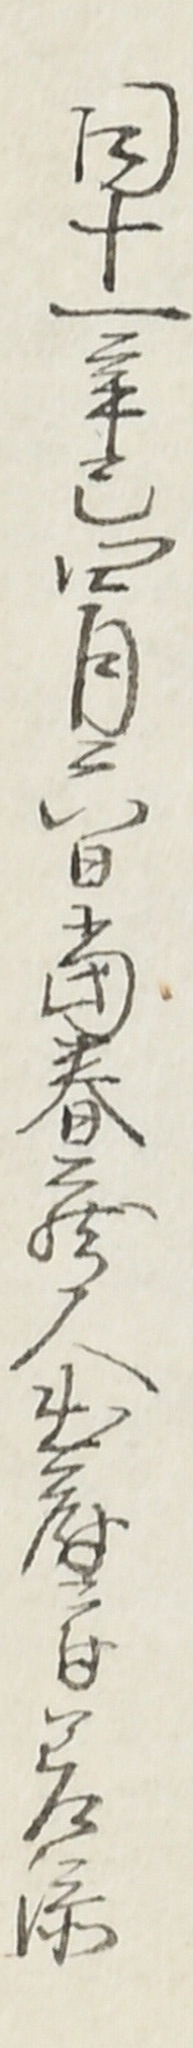一同十一辛巳四月六日当春蔵人出府ニ付差添
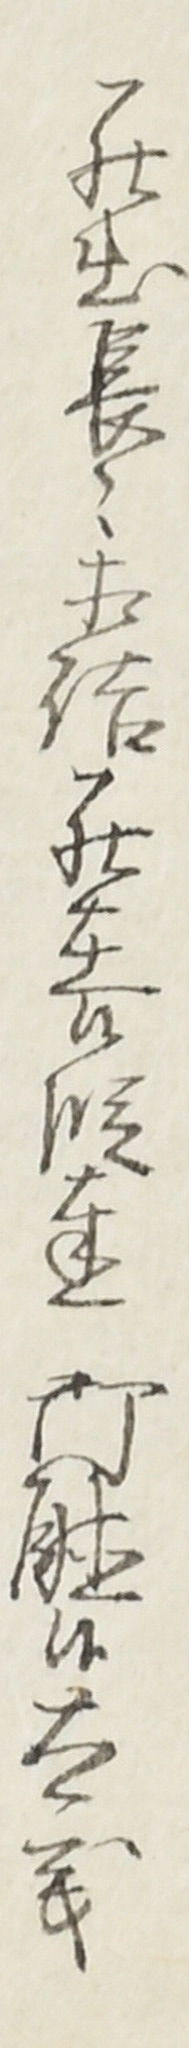罷出長々相詰罷在候段達御聴候太儀
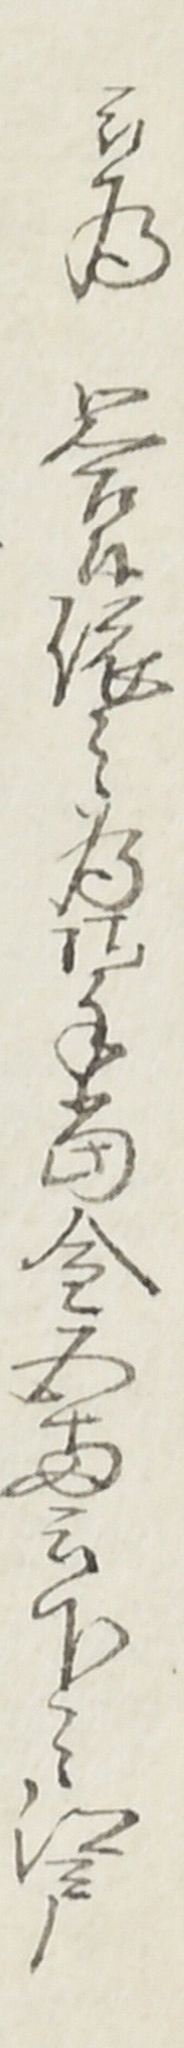被為思召依之為御手当金五両被下之江戸
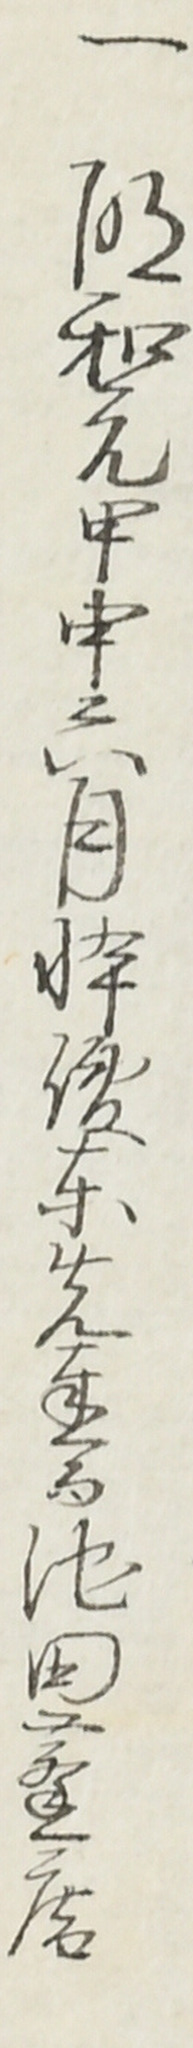一明和元甲申六月忰俊東先達而池田蓬庵
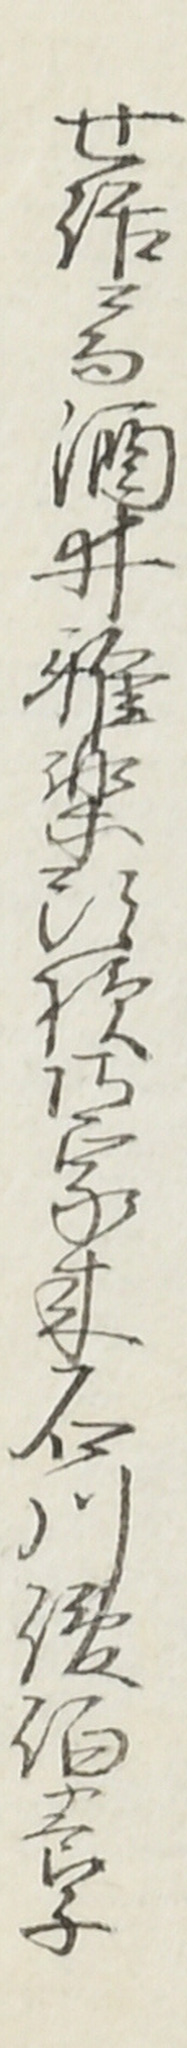世話ニ而酒井雅楽頭様御家来石川俊伯養子
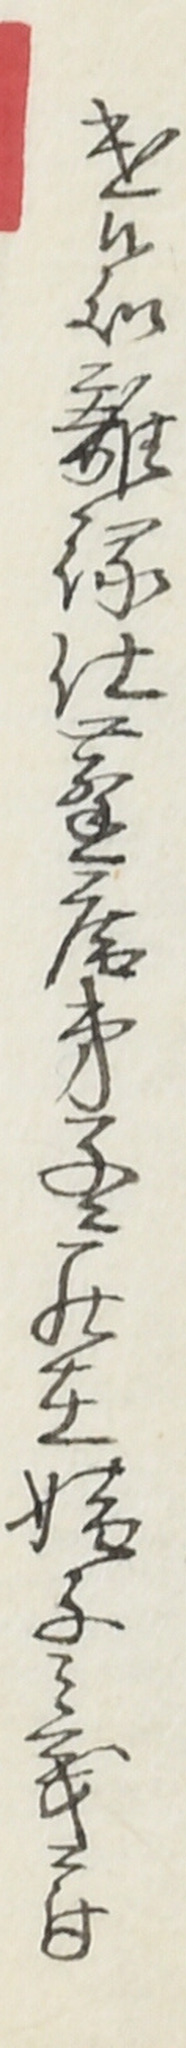遣候処離縁仕蓬庵弟子ニ罷在嫡子之義ニ付

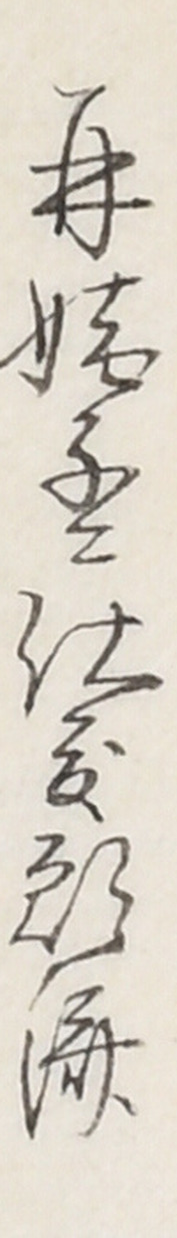再嫡子ニ仕度願済
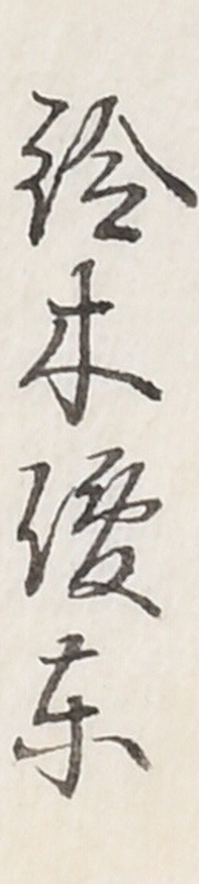鈴木俊東
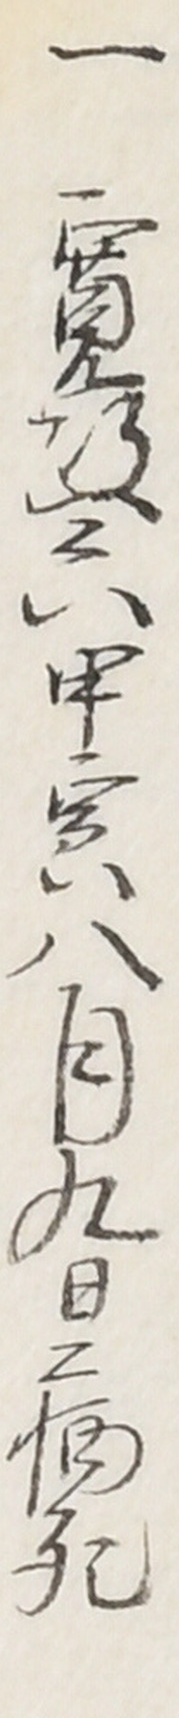一寛政六甲寅八月九日病死
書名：給人諸士勤仕録（七）
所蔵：伊那市立高遠町図書館・合同会社AMANE
